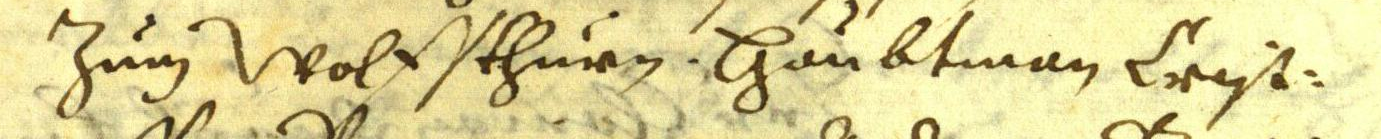Zūm Wolfsthūrn. Haūbtman Crist¬
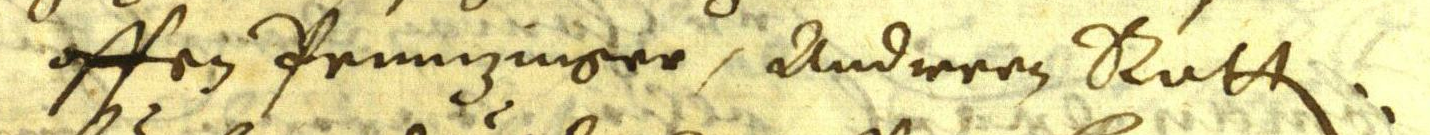offen Pennzinger, Andreen Rott¬
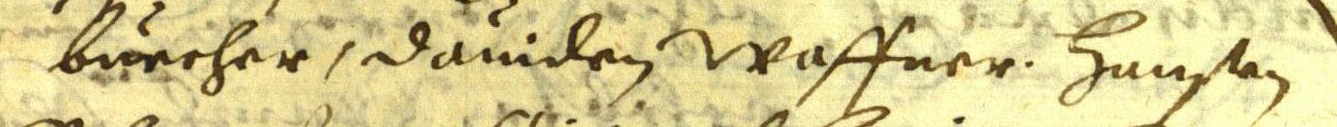būecher, daūiden Waffner. Hansen
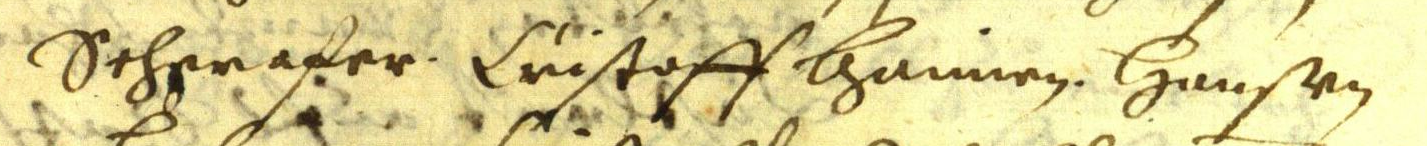Schgrafer. Cristoff Haimen. Hansen
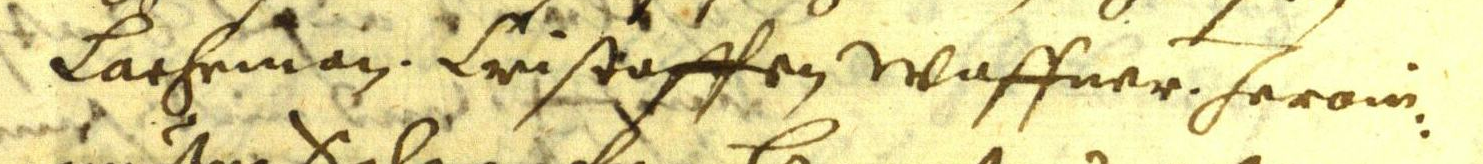Lacheman. Cristoffen Waffner. Jeroni¬
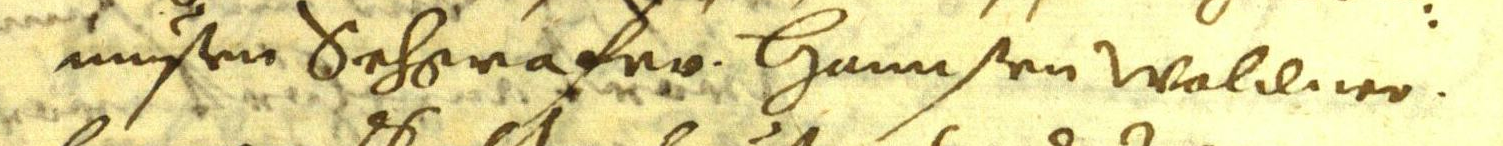mūsen Schgrafer. Hannsen Waldner.
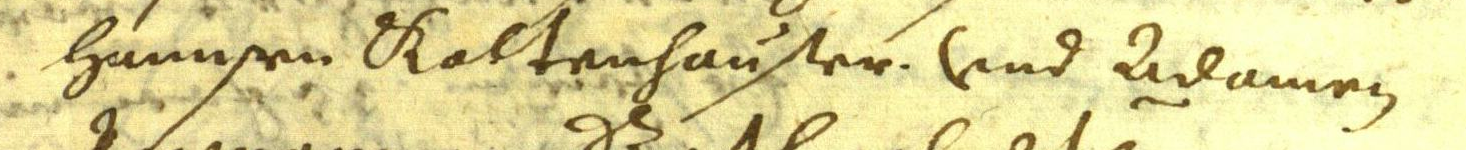Hannsen Kaltenhaūser. vnd Adamen
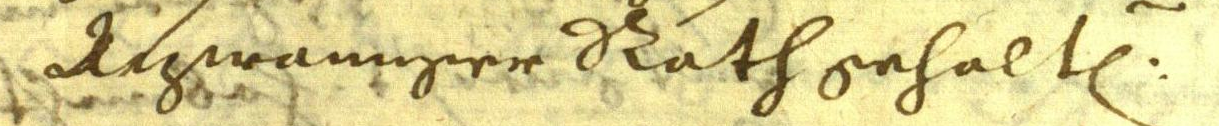Azwannger Rath gehalt.
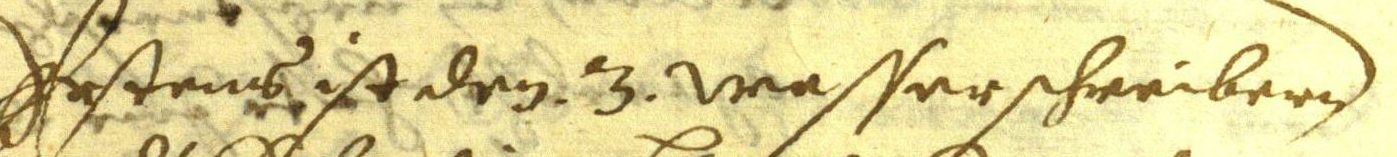Erstens ist den. 3. Wasserschreibern
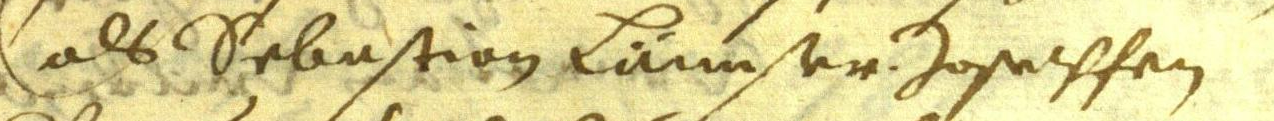als Sebastian Lännser. Joseffen
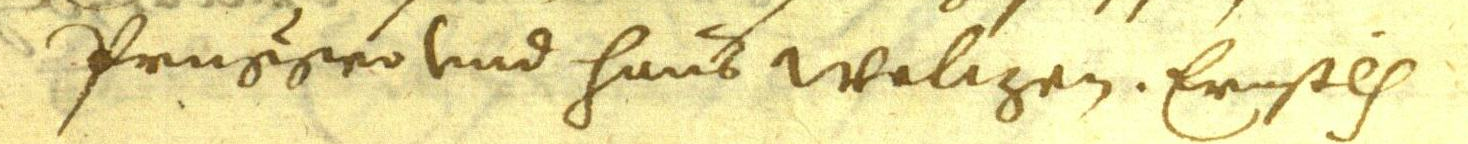Prūgger vnd hans Welzer. Ernstlich
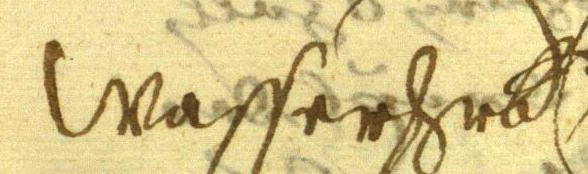Wasserschrb
